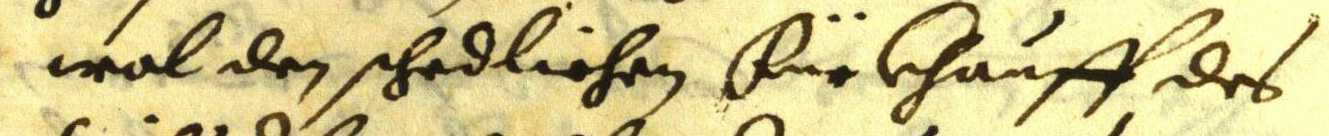wol den schedlichen Für khaūff des
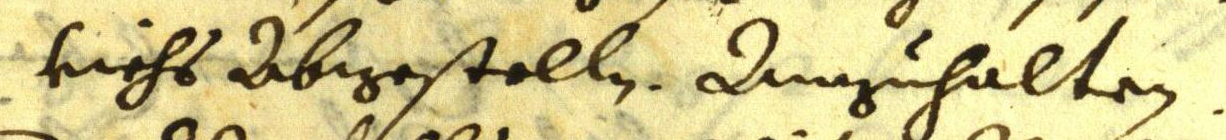Viehs Abzestelln. Anzūhalten
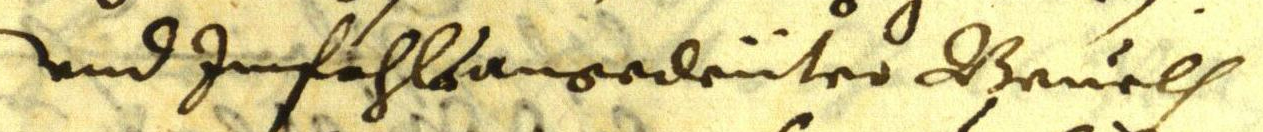vnd Imfahls angedeüter Beūelch
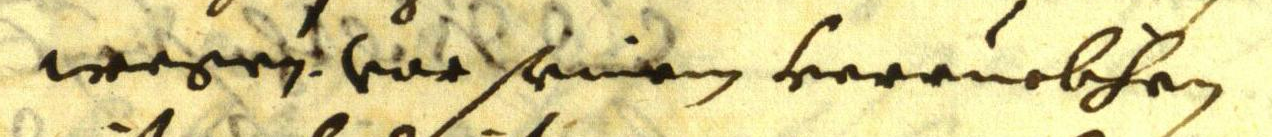wegen. vor seinem verrūckhen
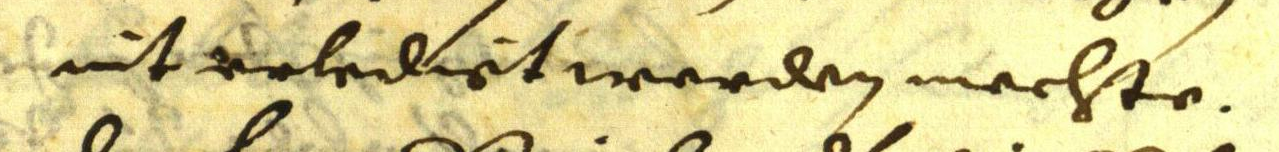nit erledigt werden mechte.
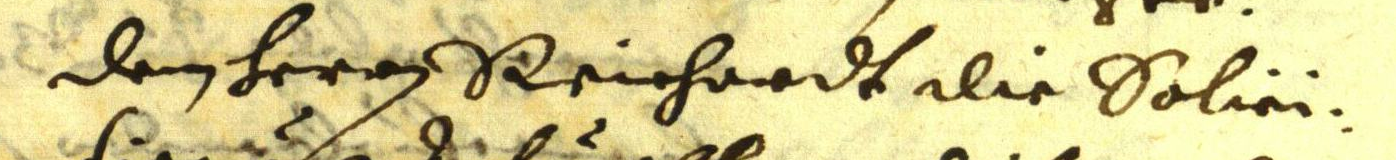dem herrn Reichardt die Solici¬
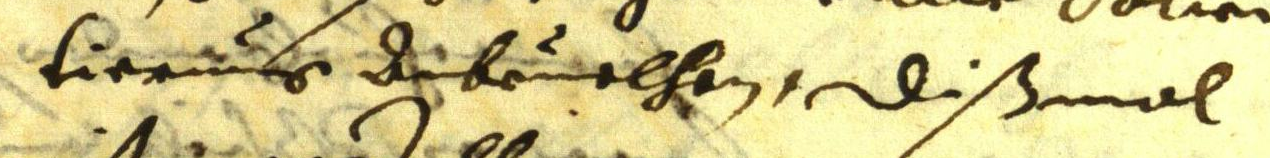tierūng Anbeūelhen, dißmal
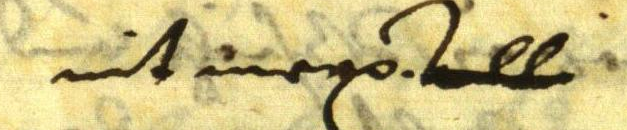nit mer etc. All
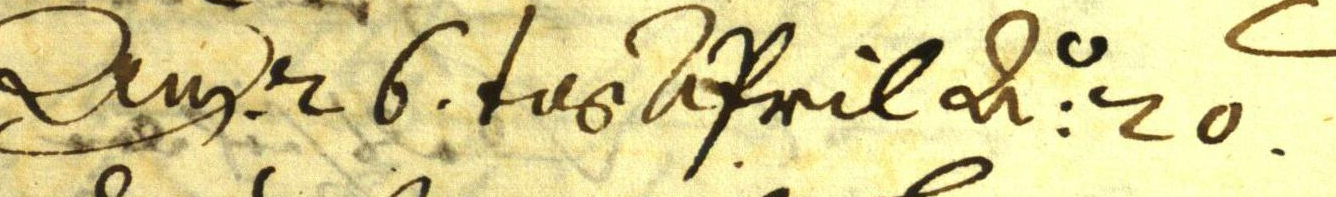Am. 26. tag APril Ao: 20t.
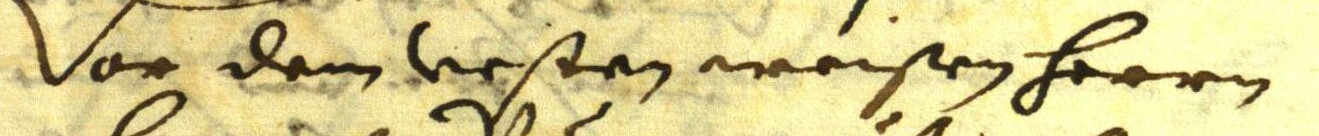Vor dem vesten weisen herrn
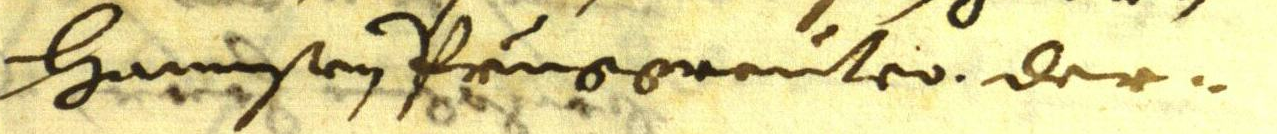Hannsen Prūggreūter. der¬
